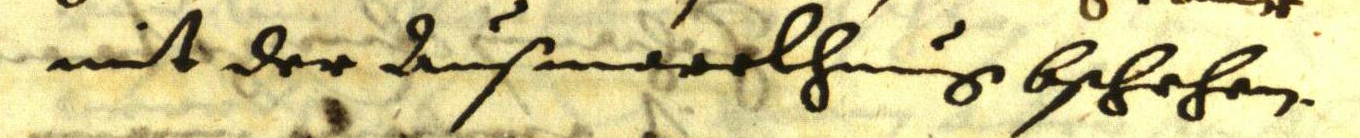mit der Aūsmerckhūng beschehen.
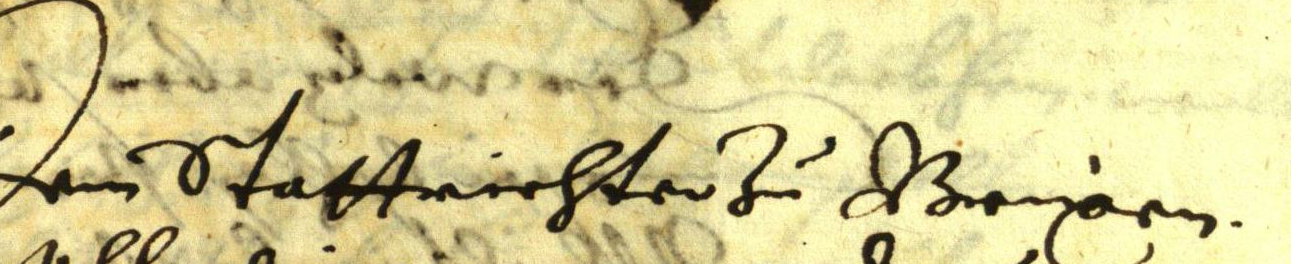Dem Stattrichter Zū Brixen.
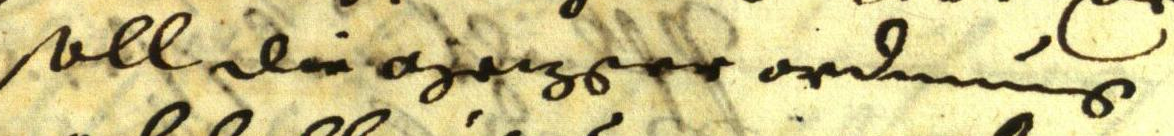soll die Mezger ordnūng
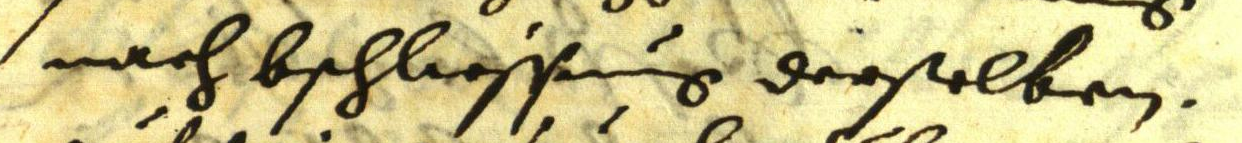nach bschliessūng derselben.
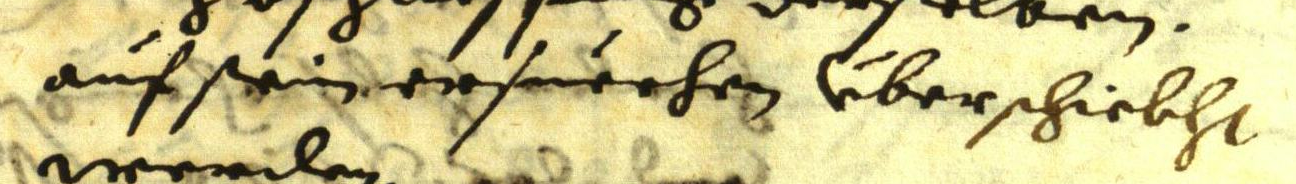aūf sein ersūechen v̄berschickht
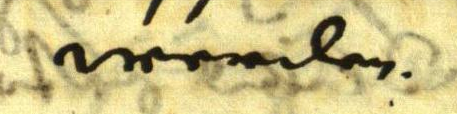werden.
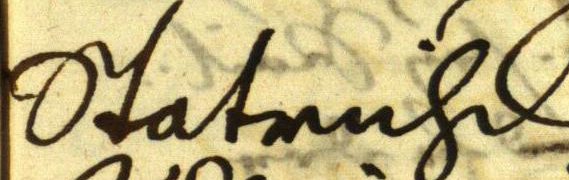Statricht
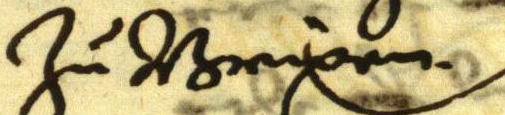Zū Brixen.
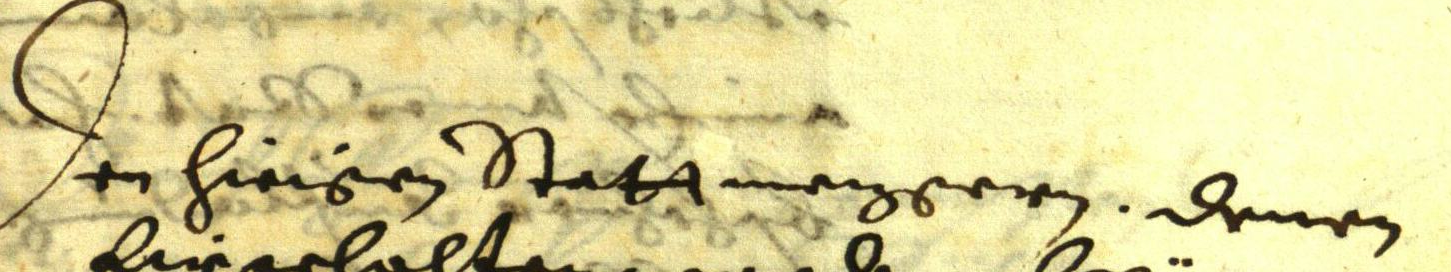Den hieigen Stattmezgern. denen
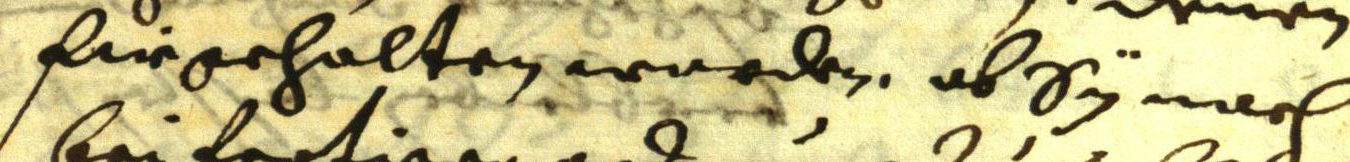fir gehalten worden. ob Sÿ noch
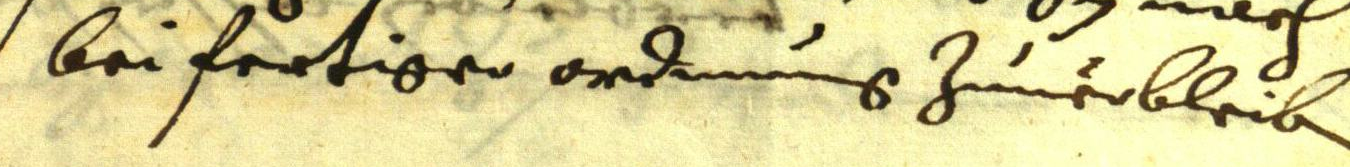bei fertiger ordnūng Zūūerbleib
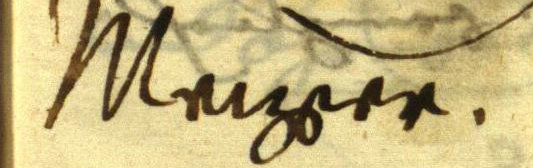Mezger.
